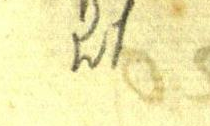21
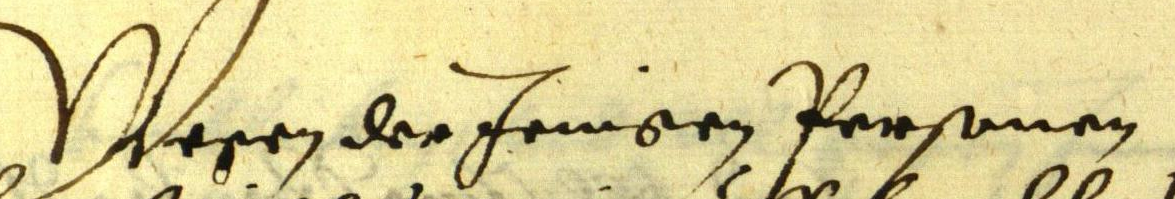Wegen der Jenigen Personen
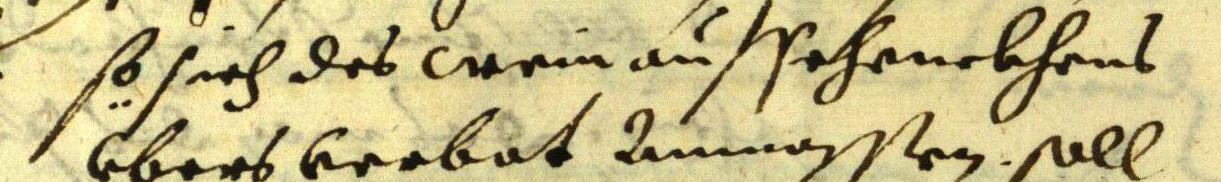so sich des wein aūsschenckhens
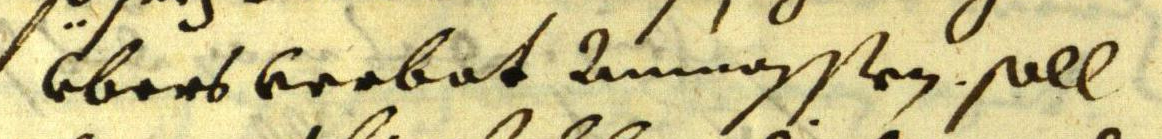v̈bers verbot Anmassen. soll
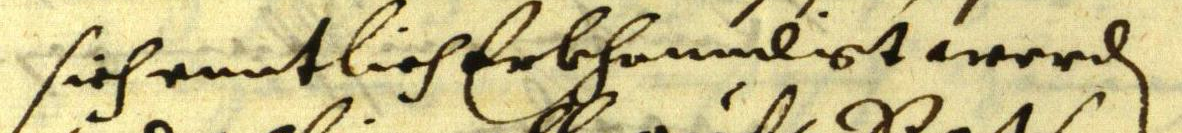sich enntlich Erkhonndigt werd.
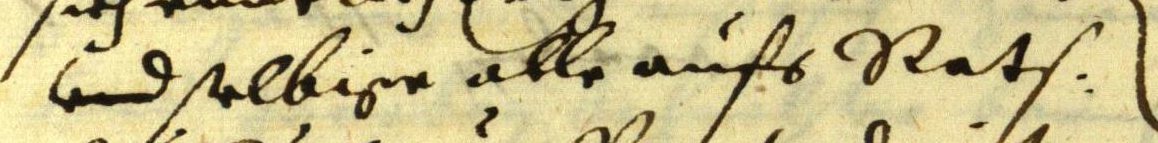vnd selbige alle aūfs Rats¬
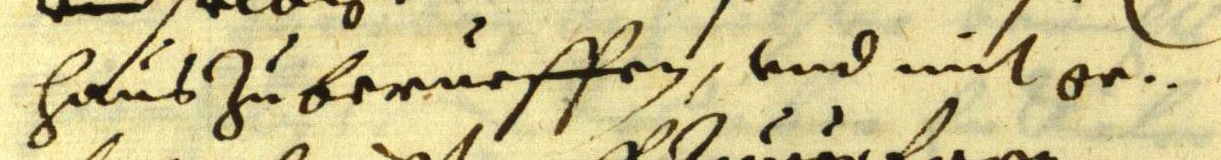haūs Zū berūeffen, vnd mit ge¬
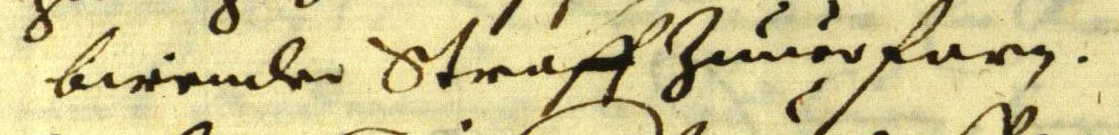birender Straff Zūūerfarn.
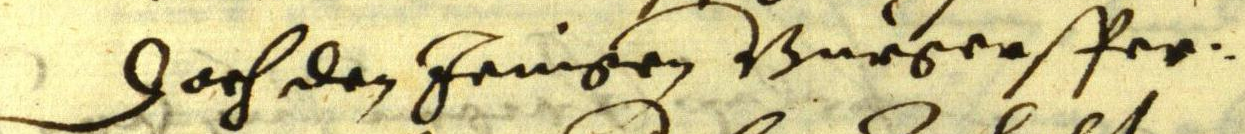Doch den Jenigen Būrgersper¬
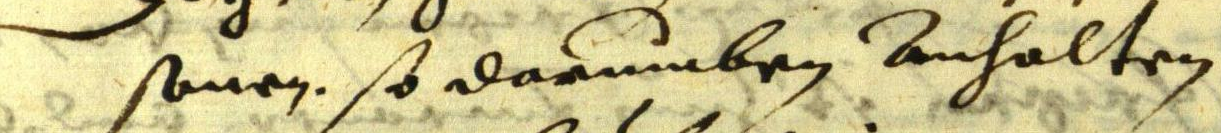sonen. so darūmben Anhalten,
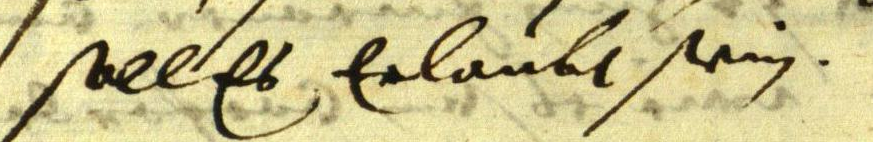soll Es Erlaūbt sein.
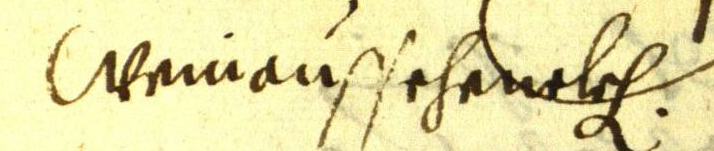Wein aūsschenckh.
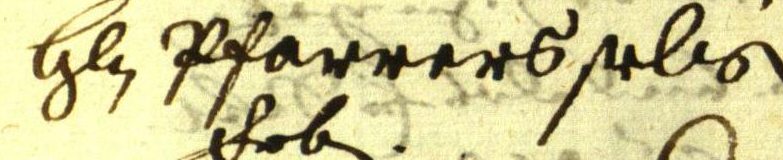Hln Pfarrers selig
